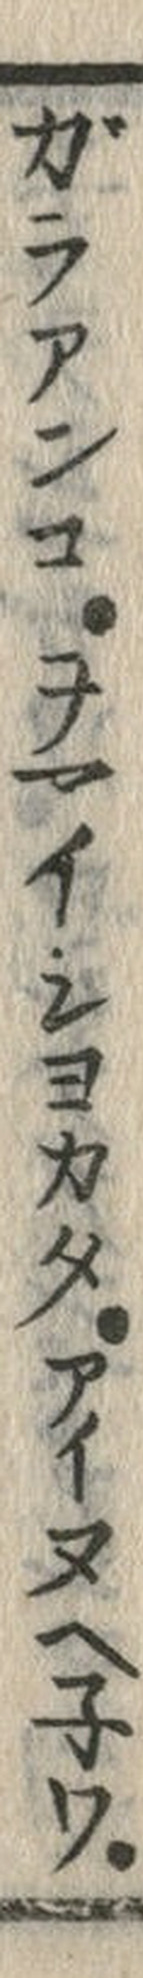ガラアンコ。ヲマイシヨカタ。アイヌヘネワ。
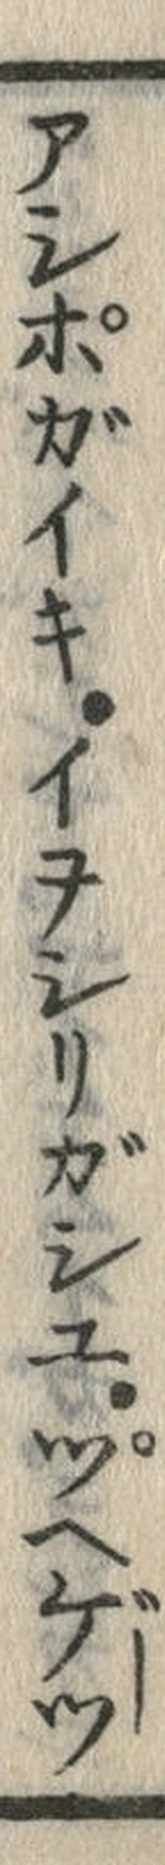アシポガイキ。イヲシリガシユ。ツ゚ヘゲツ
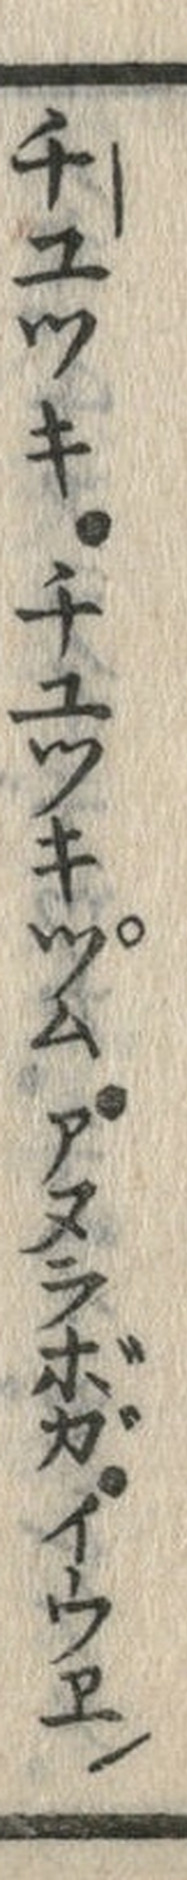チユツキ。チユツキツ゚ム。アヌラボガ。イウヱ
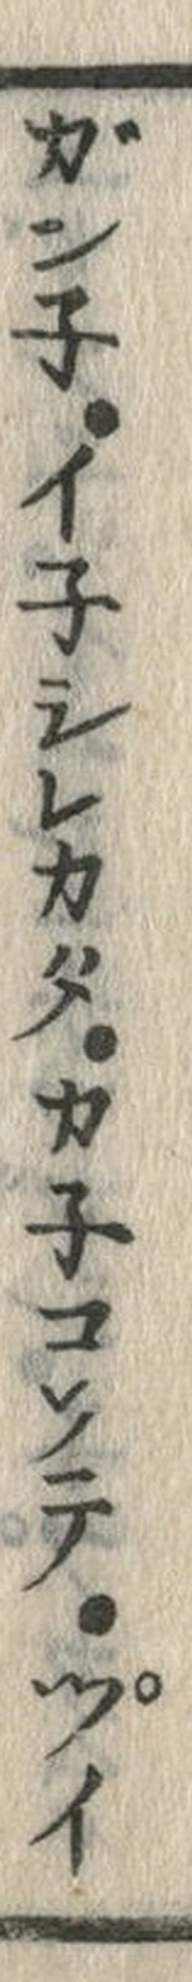ガンネ。イネシレカタ。カネコソテ。ツ゚イ
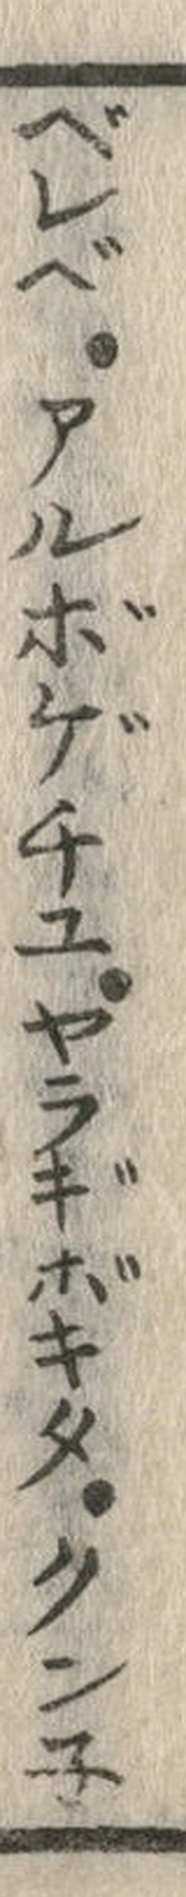ベレベ。アルボゲチユ。ヤラギボキタ。クンネ

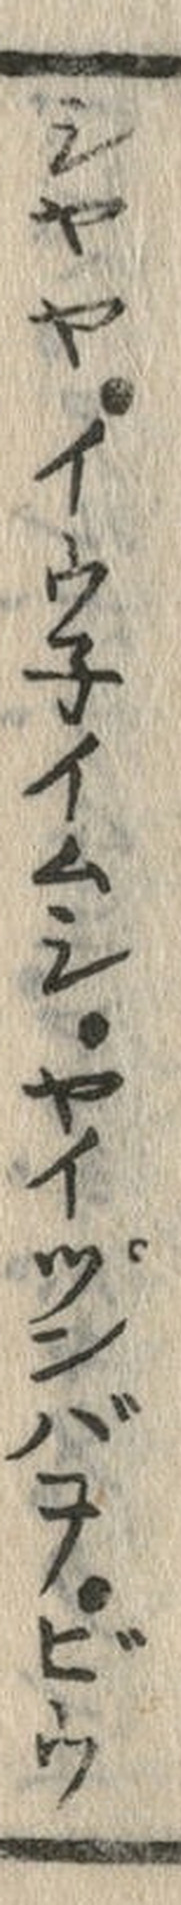シヤヤ。イウネイムシ。ヤイツ゚ンバヲ。ビウ
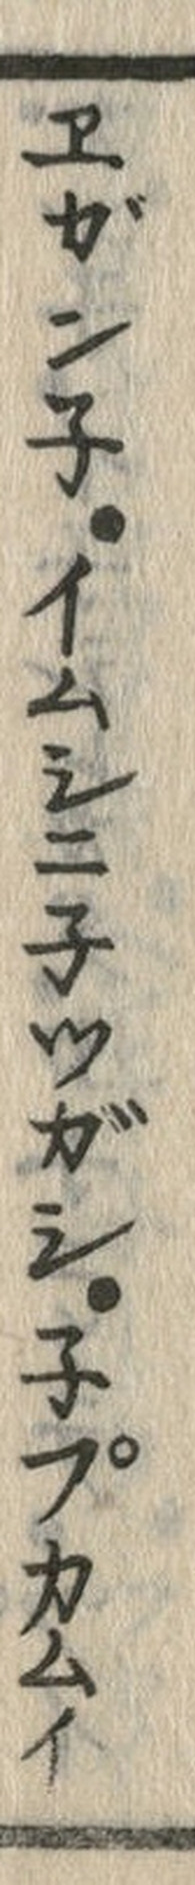ヱガンネ。イムシニネツガシ。ネプカムイ
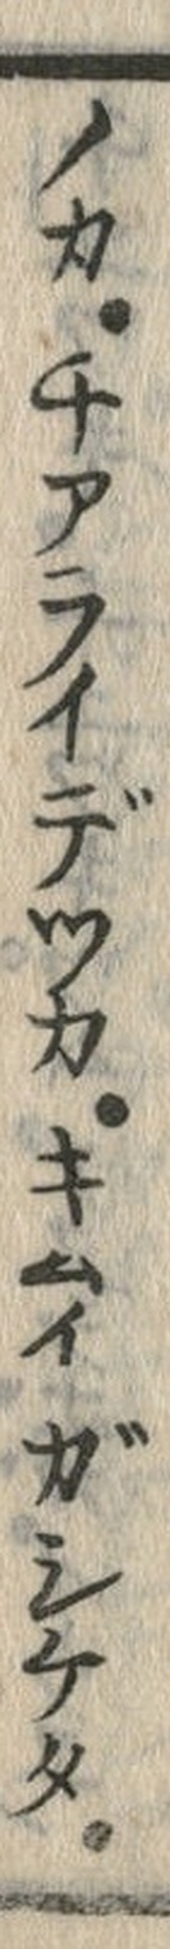ノカ。チアライデツカ。キムイガシケタ。
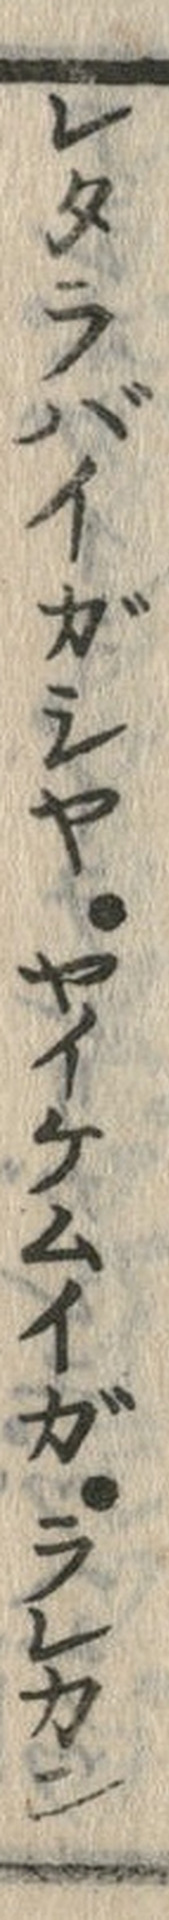レタラバイガシヤ。ヤイケムイガ。ラレカン
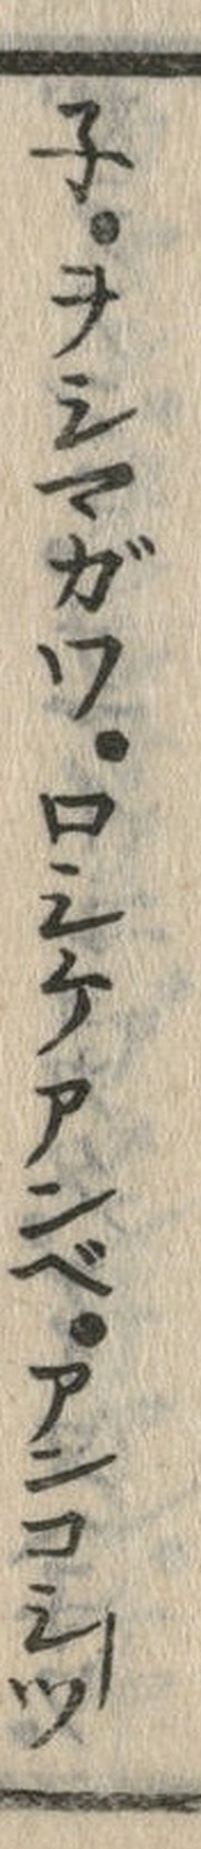ネ。ヲシマガワ。ロシケアンベ。アンコシツ
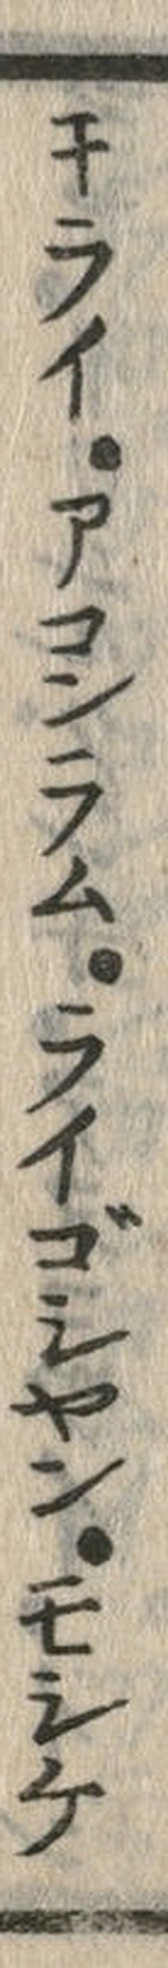キライ。アコンラム。ライゴシヤン。モシケ
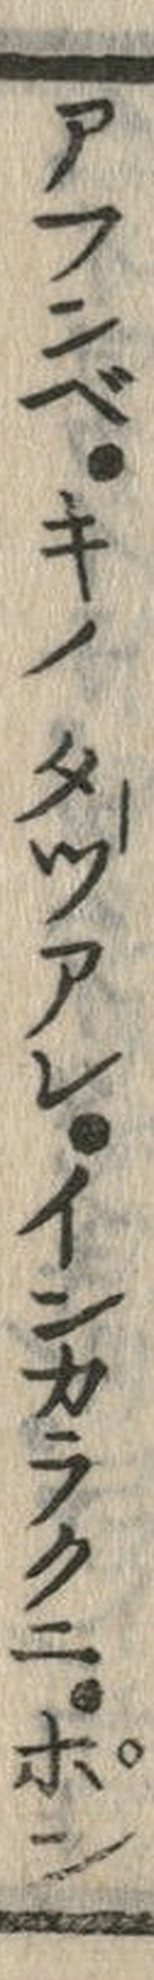アフンベ。キノタツアレ。インカラクニ。ポン
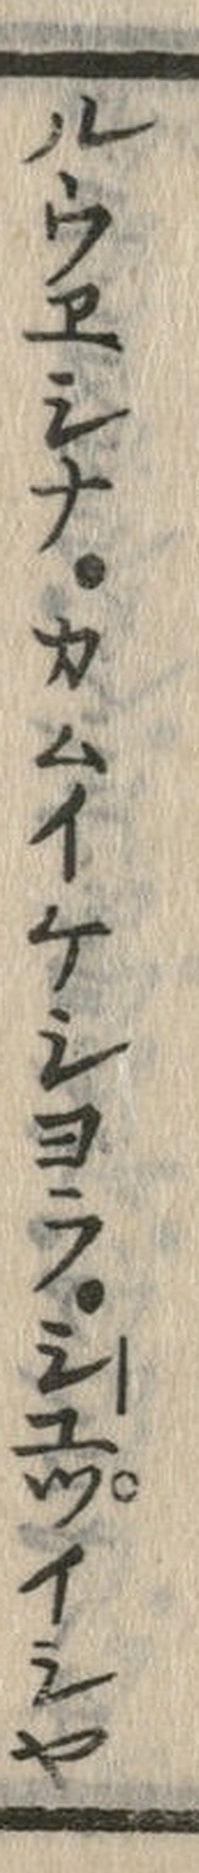ルウヱシナ。カムイケシヨラ。シユツ゚イシヤ

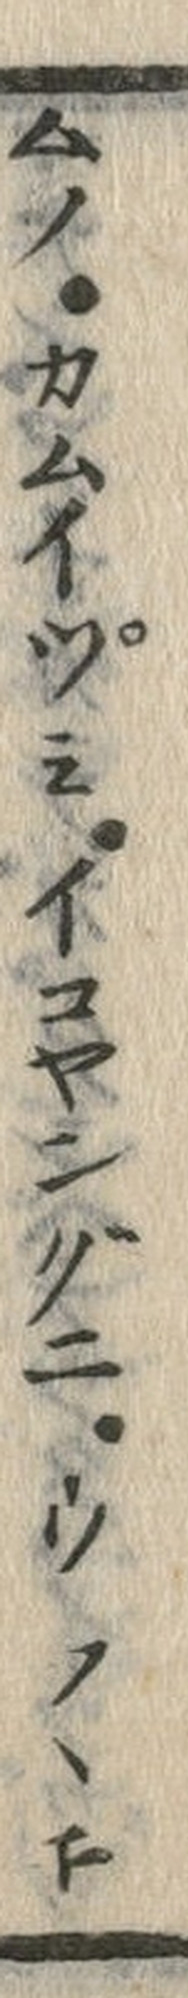ムノ。カムイツ゚ミ。イコヤングニ。ウラヽモ
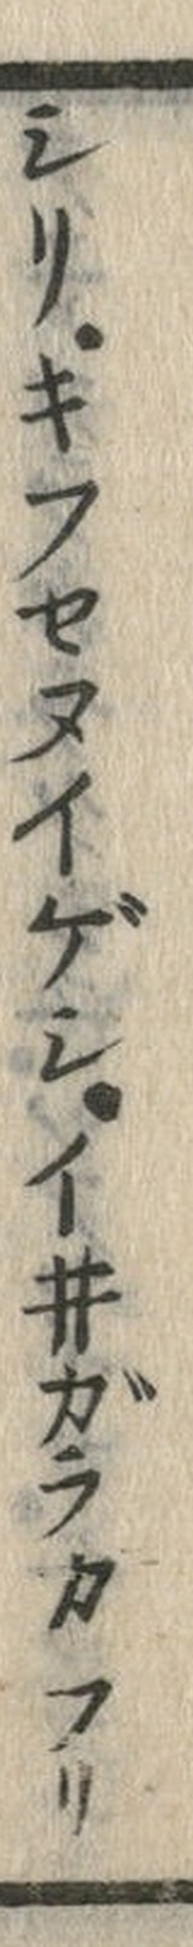シリ。キフセヌイゲシ。イヰガラカラリ
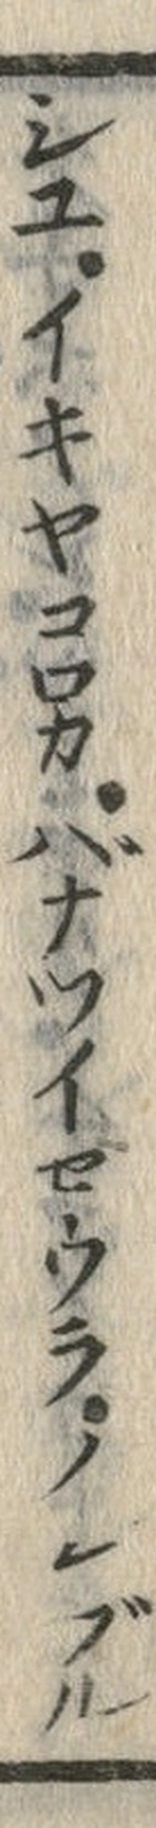シユ。イキヤコロカ。バナツイセウラ。ノシブル
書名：蝦夷方言藻汐草　坤巻
